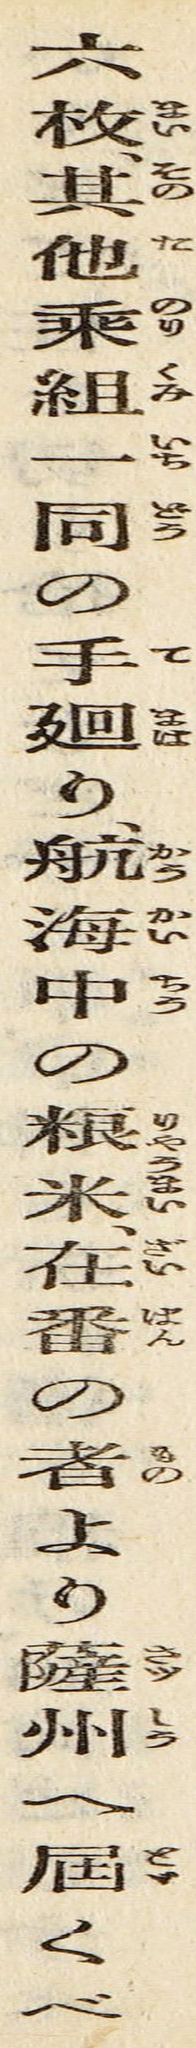六枚、其他乗組一同の手廻り、航海中の糧米、在番の者より薩州へ届くべ
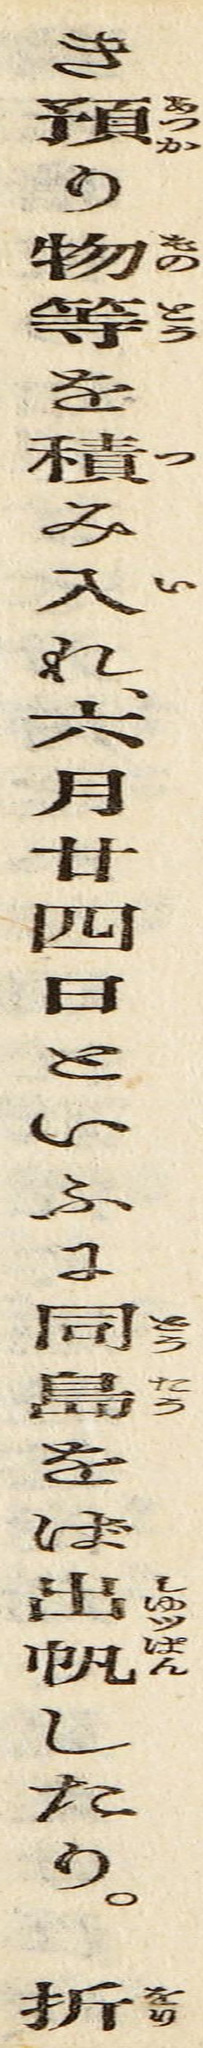き預り物等を積み入れ、六月廿四日といふに同島をば出帆したり。折
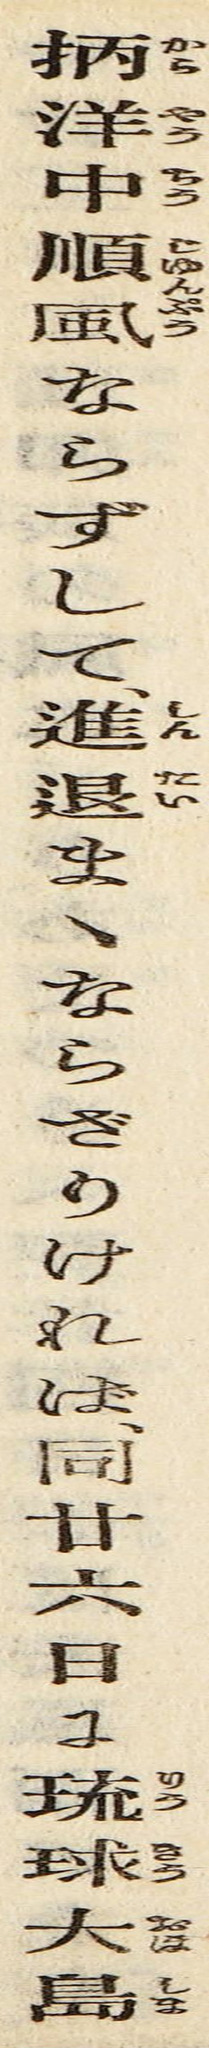抦洋中順風ならずして、進退まヽならざりければ、同廿六日に琉球大島
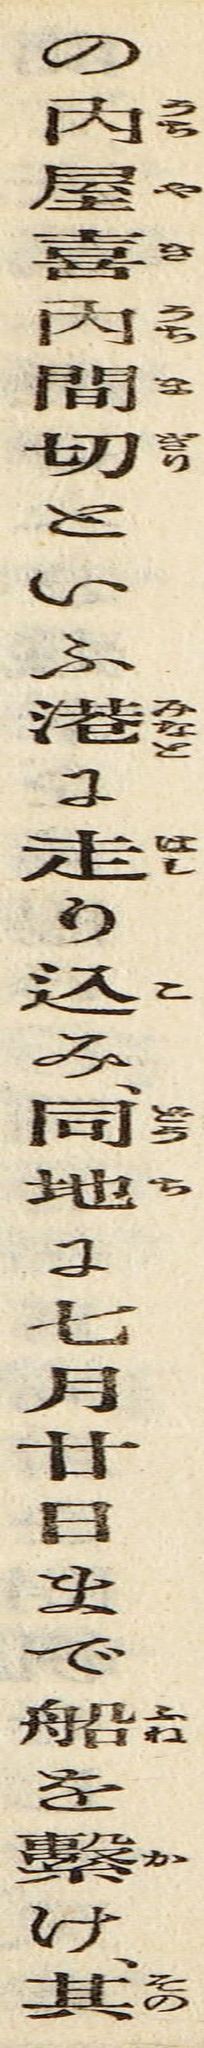の内屋喜内間切といふ港に走り込み、同地に七月廿日まで船を繫け、其

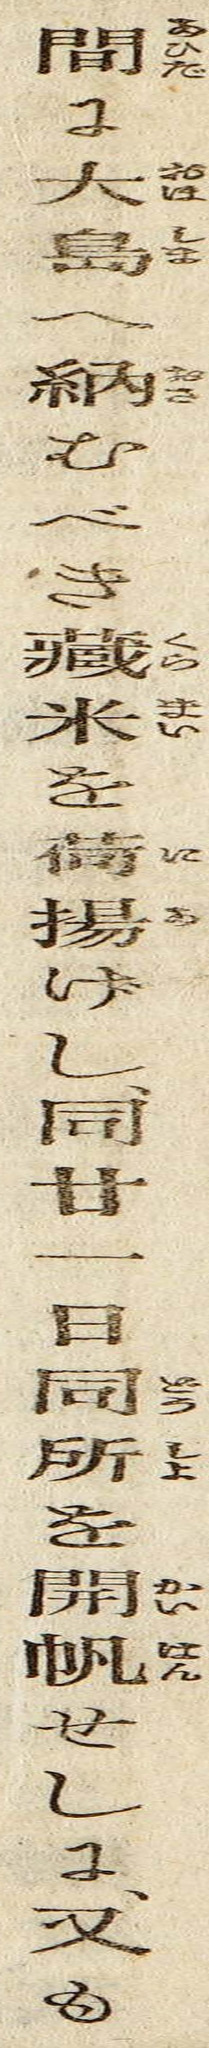間に大島へ納むべき蔵米を荷揚げし、同廿一日同所を開帆せしに、又も
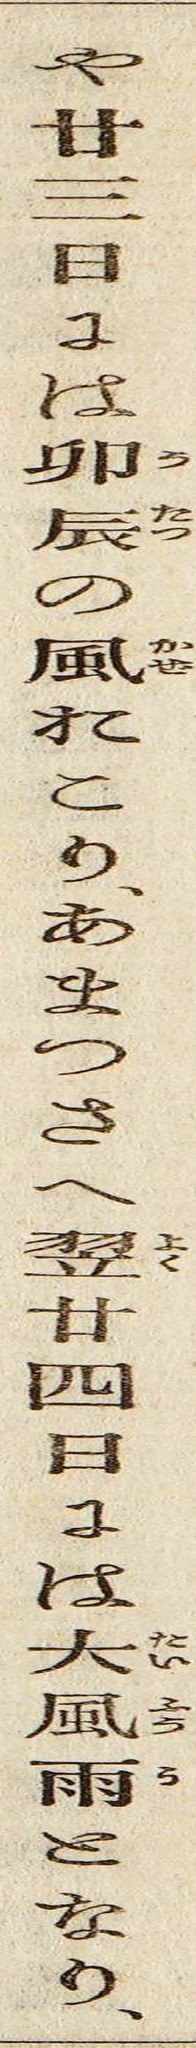や廿三日には卯辰の風おこり、あまつさへ翌廿四日には大風雨となり、
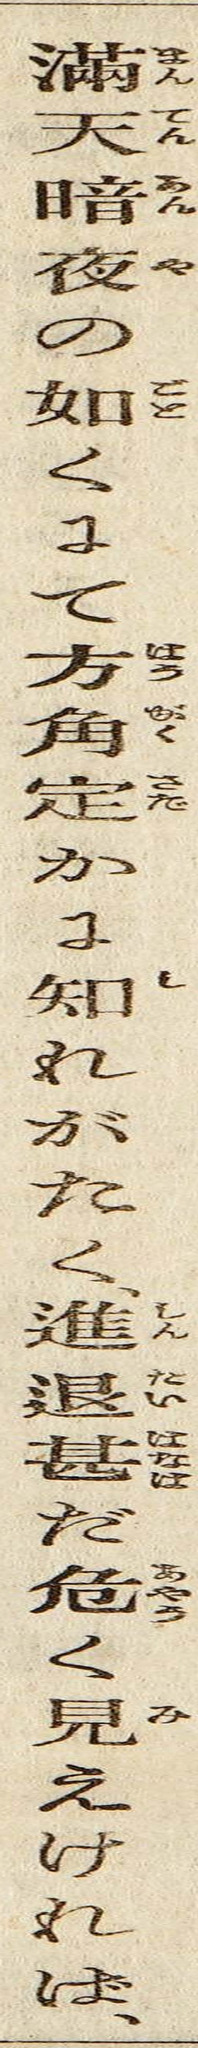満天暗夜の如くにて方角定かに知れがたく、進退甚だ危く見えければ、
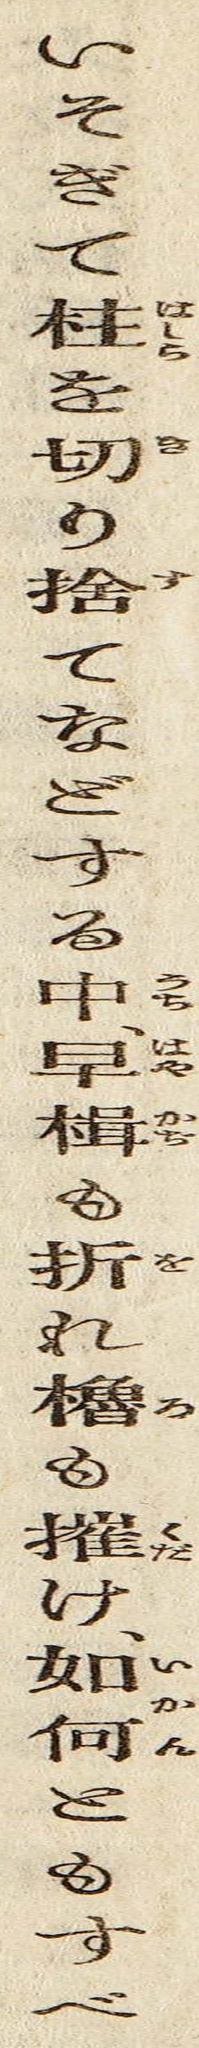いそぎて柱を切り捨てなどする中、早楫も折れ櫓も摧け、如何ともすべ
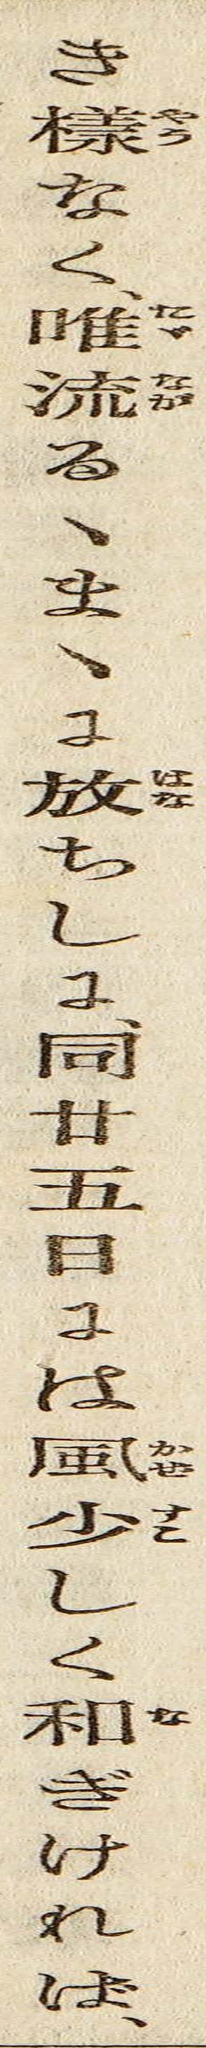き様なく、唯流るヽまヽに放ちしに、同廿五日には風少しく和ぎければ、
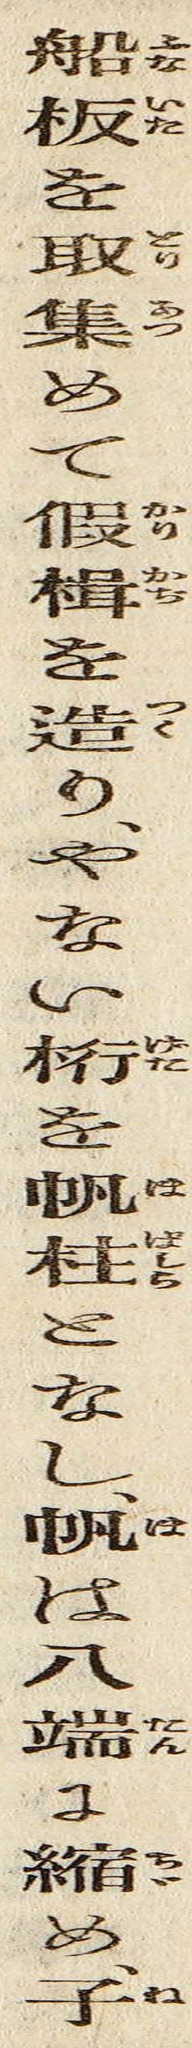船板を取集めて仮楫を造り、やまい桁を帆柱となし、帆は八端に縮め、子
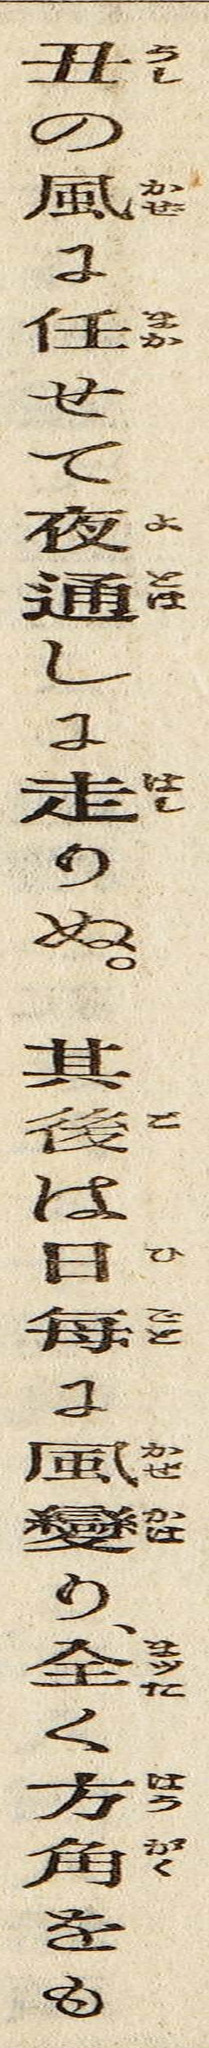丑の風に任せて夜通しに走りぬ。其後は日毎に風変り、全く方角をも
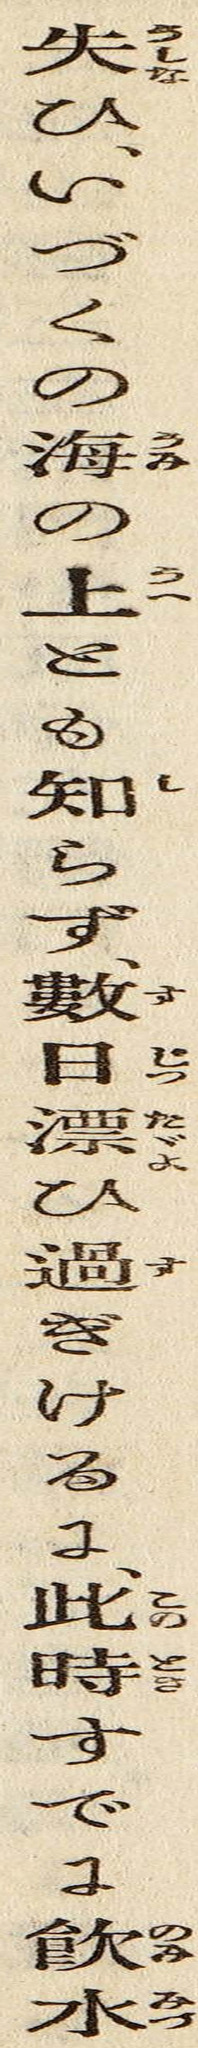失ひ、いづくの海の上とも知らず、数日漂ひ過ぎけるに、此時すでに飲水
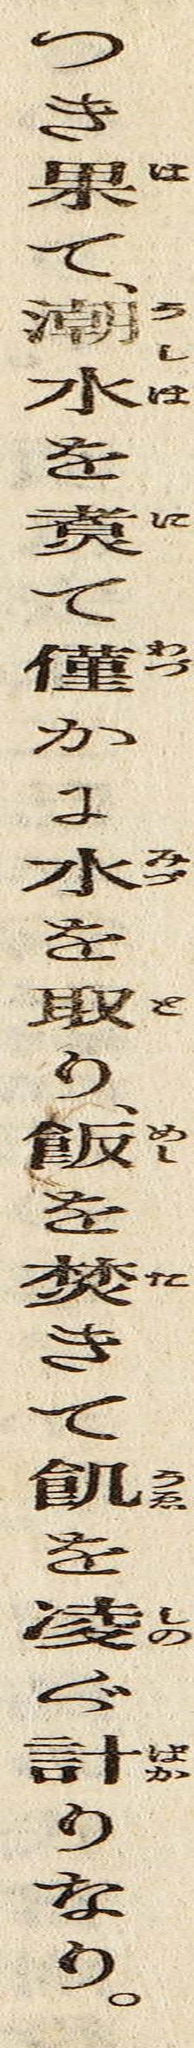つき果て、潮水を煮て僅かに水を取り、飯を焚きて飢を凌ぐ計りなり。
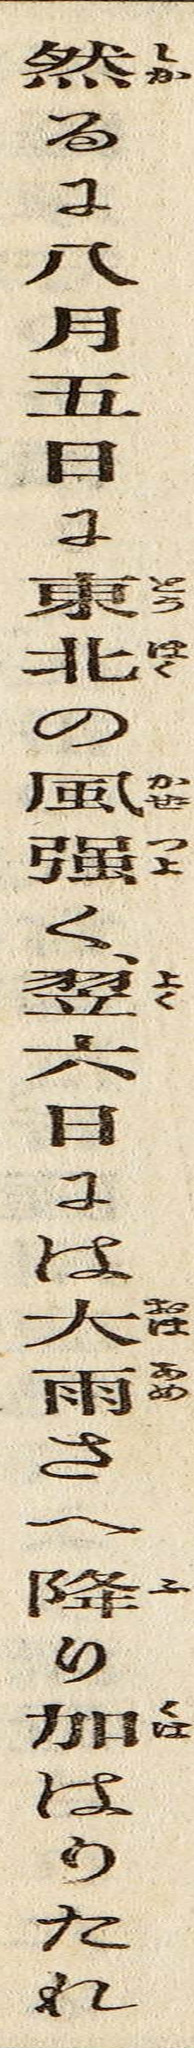然るに八月五日に東北の風強く、翌六日には大雨さへ降り加はりたれ
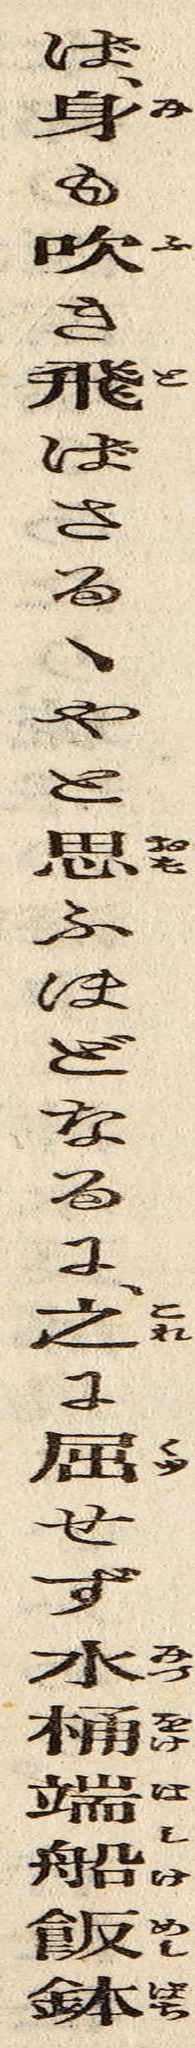ば、身も吹き飛ばさるヽやと思ふほどなるに、之に屈せず水桶端船飯鉢
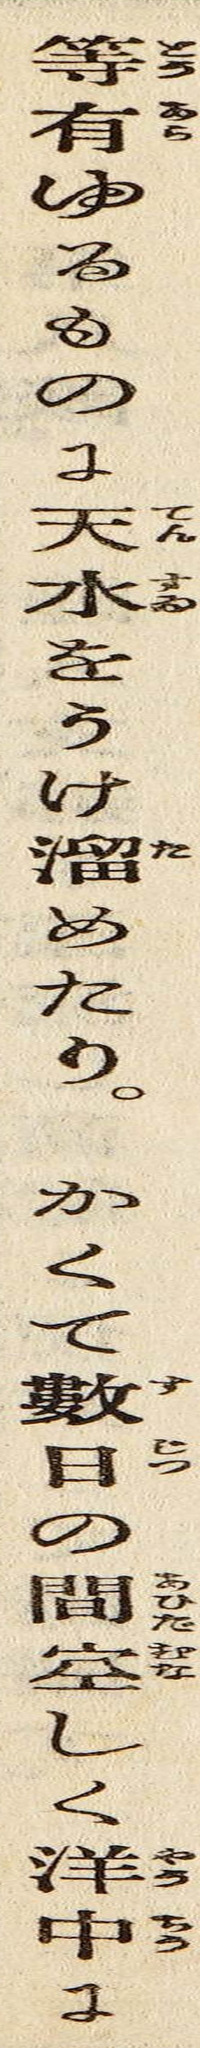等有ゆるものに天水をうけ溜めたり。かくて数日の間空しく洋中に
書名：日本漂流譚
